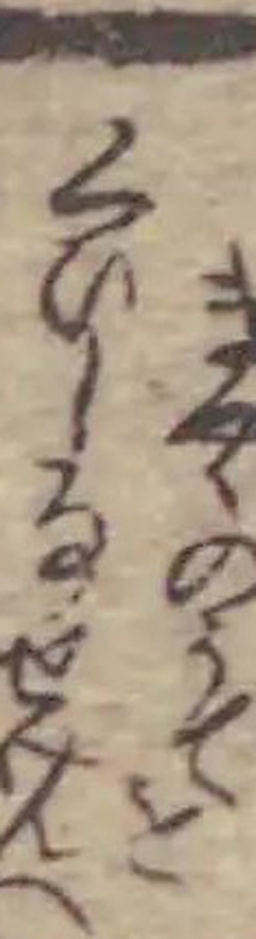くひしるせけんへ
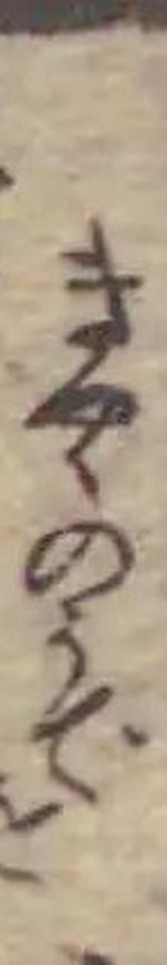きやくのうでを
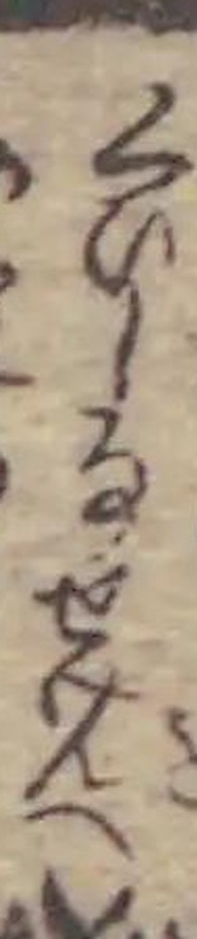くひしるせけんへ
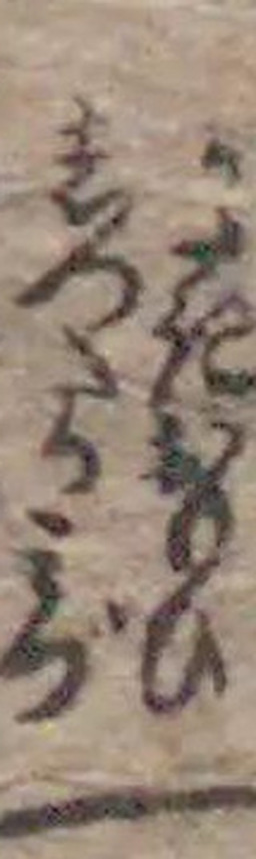しつたかみづ
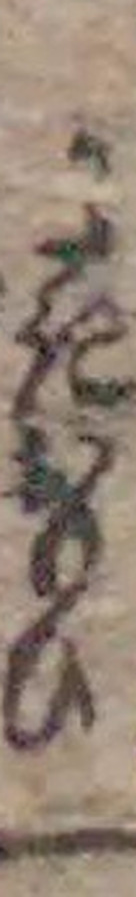かたきおもひ
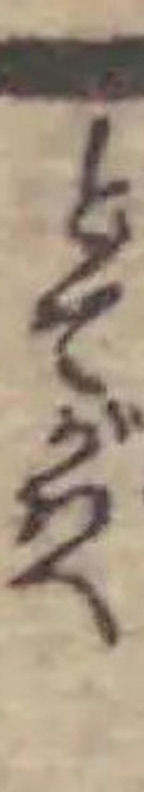とてがはへ
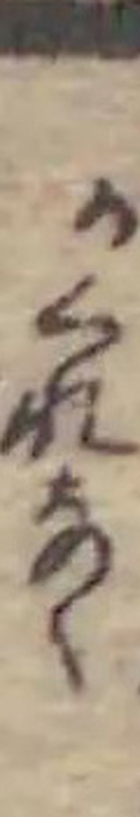かくれなく
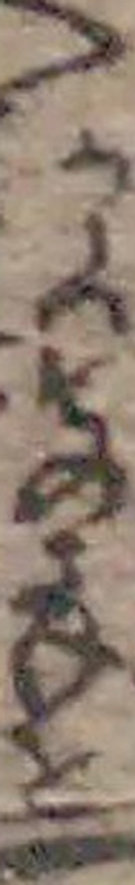からはそのさけを
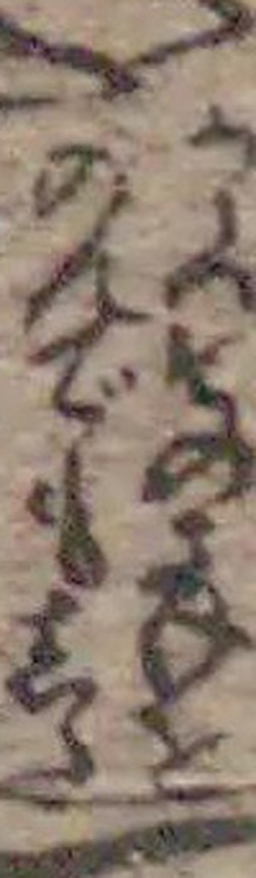のんでもした
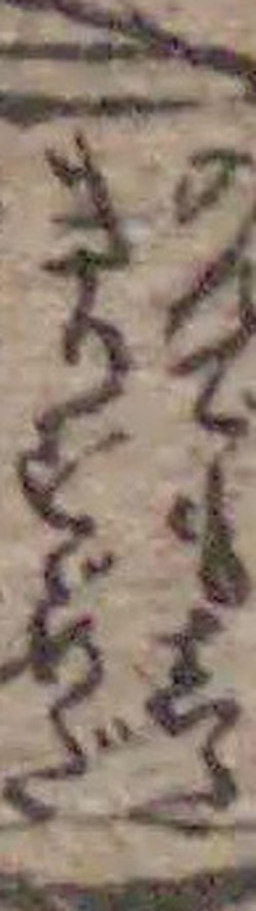きりすゞめだ
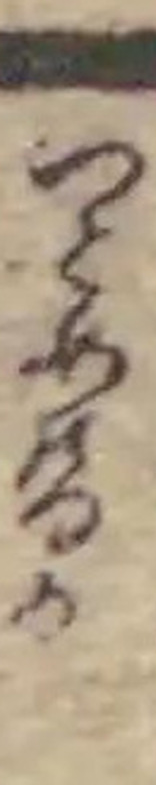つとめけるか
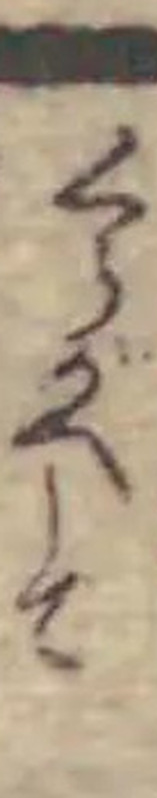くらがへして
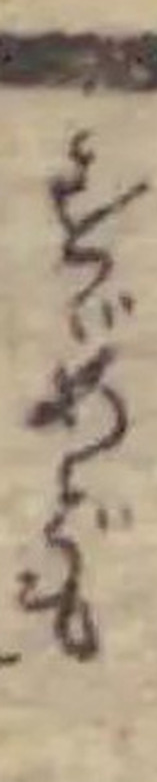すゞめども
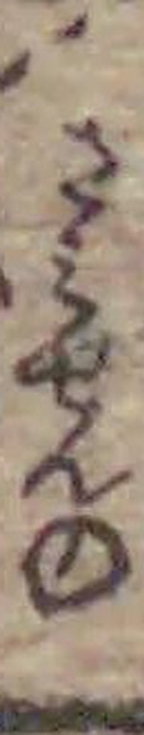さみせんの
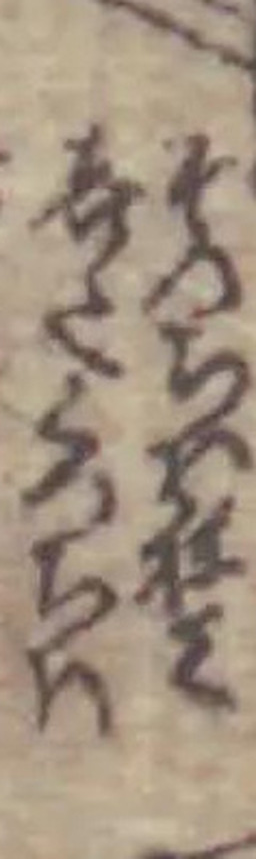したこつちは
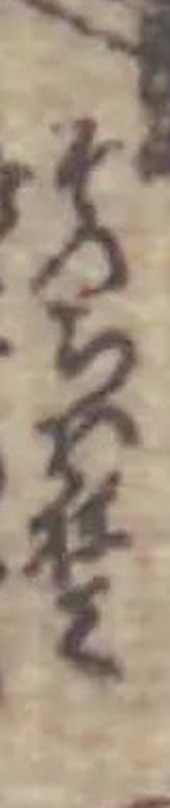そつちはねこ
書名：冷水灰毛猫 2巻
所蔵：国立国会図書館 National Diet Library, JAPAN
